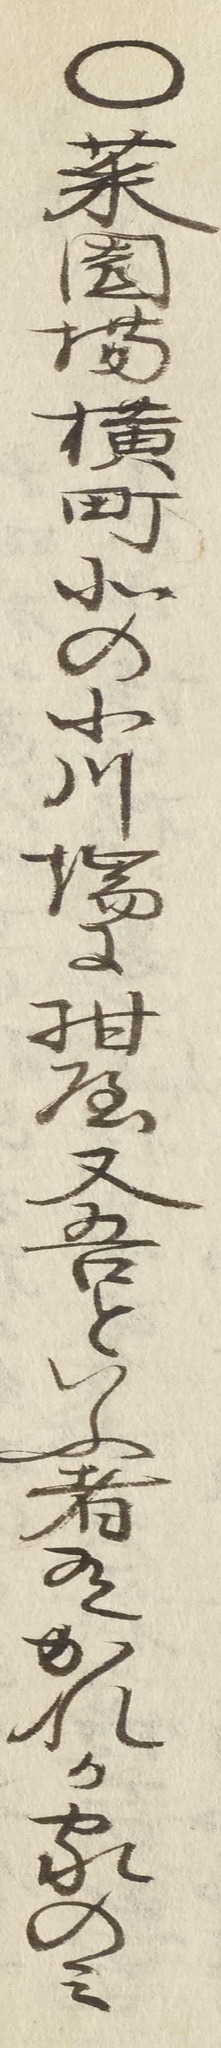〇菜園場横町北の小川端に紺屋又吾といふ者有かれか家のみ
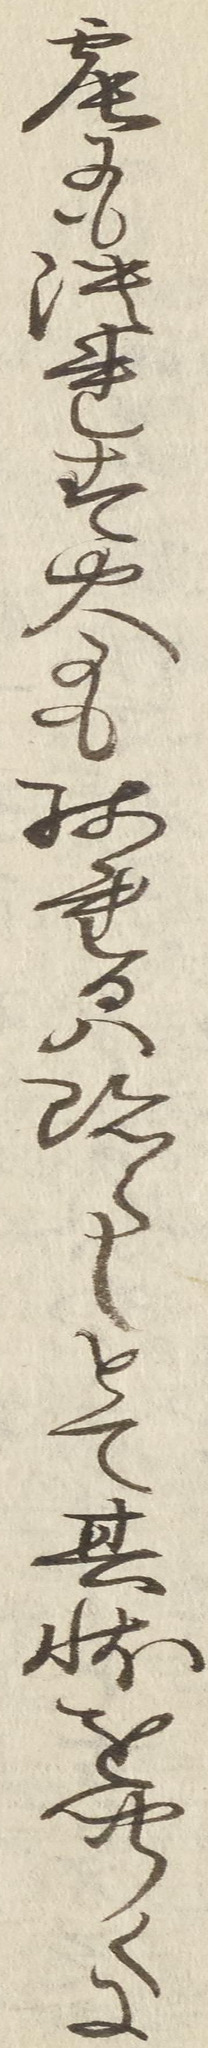震にも潰れす火にも残れるは珍事とて其状を聞くに
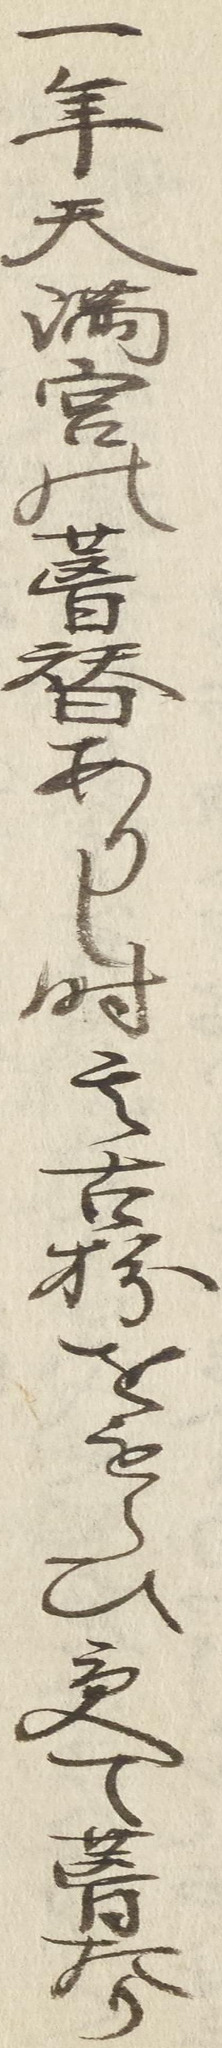一年天満宮の葺替ありし時其古扮をもらひ受て葺たり
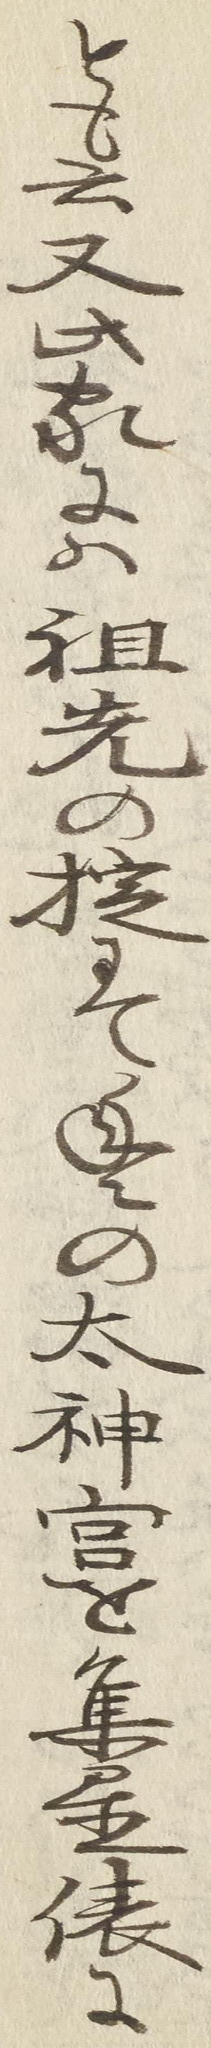とも云又此家には祖先の掟にて年々の太神宮を集置俵に
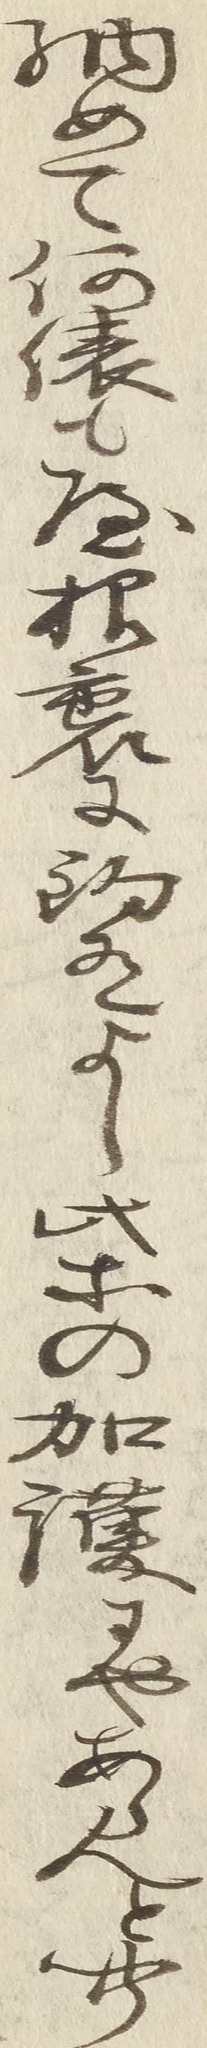納めて何俵も屋根裏に釣有よし此等の加護にやあらんと聞
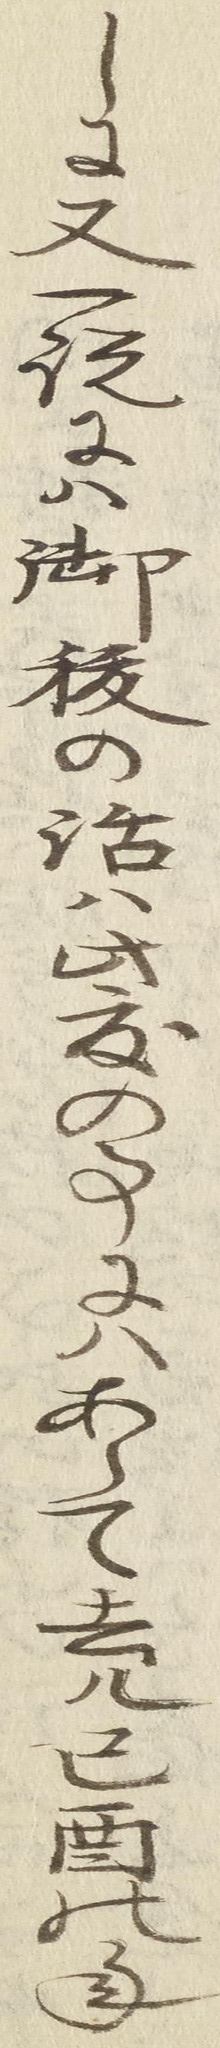しに又一説には御祓の活は此度の事にはあらて去る己酉の年
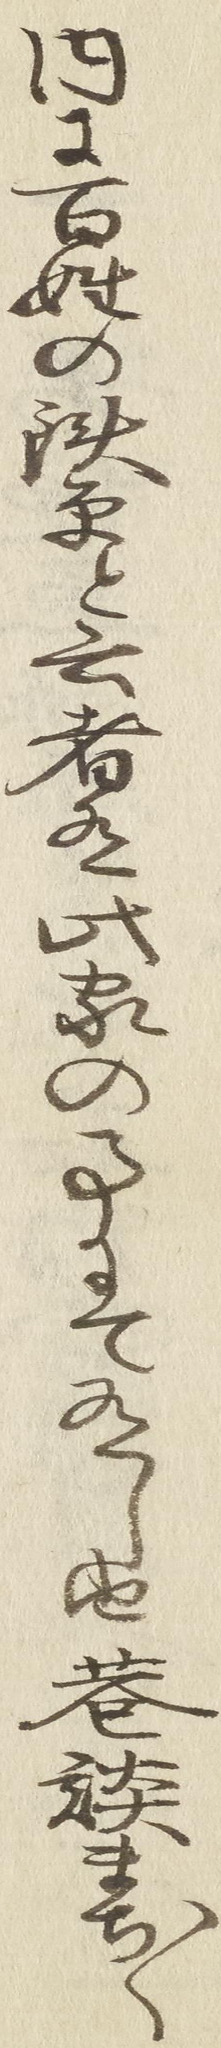内に百姓の鉄平と云者有此家の事にて有し由巷談まち〳〵
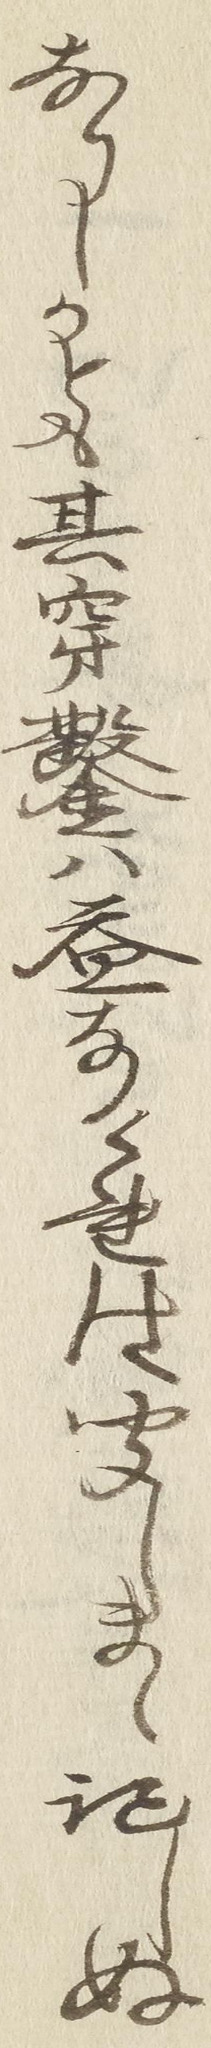なりしかとも其穿鑿は益なけれは聞しまゝ記しぬ
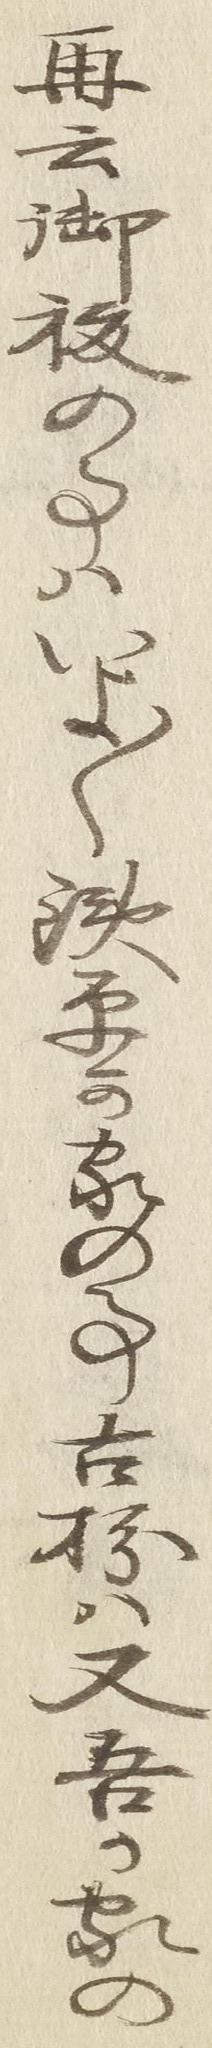再云御祓の事はいよ〳〵鉄平か家の事古扮は又吾が家の
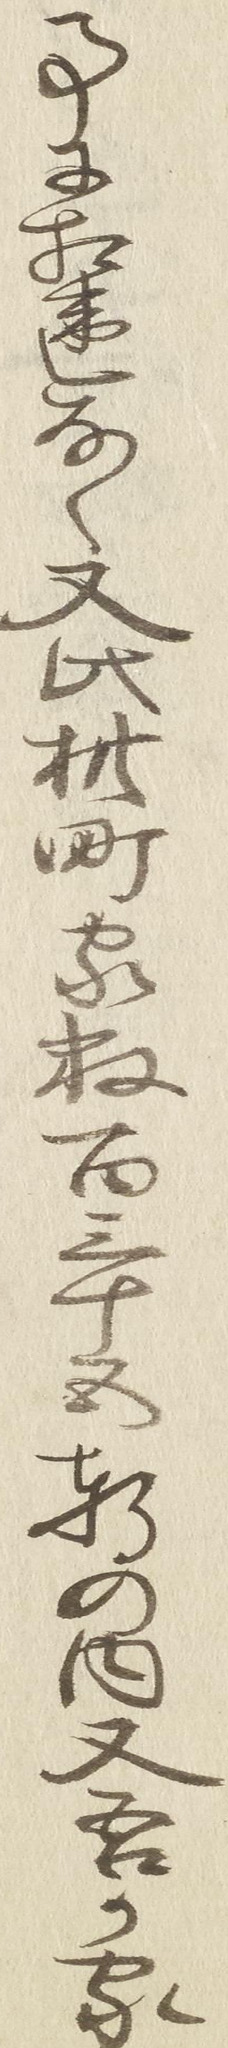事に相違なく又此横町家数百三十五軒の内又吾か家
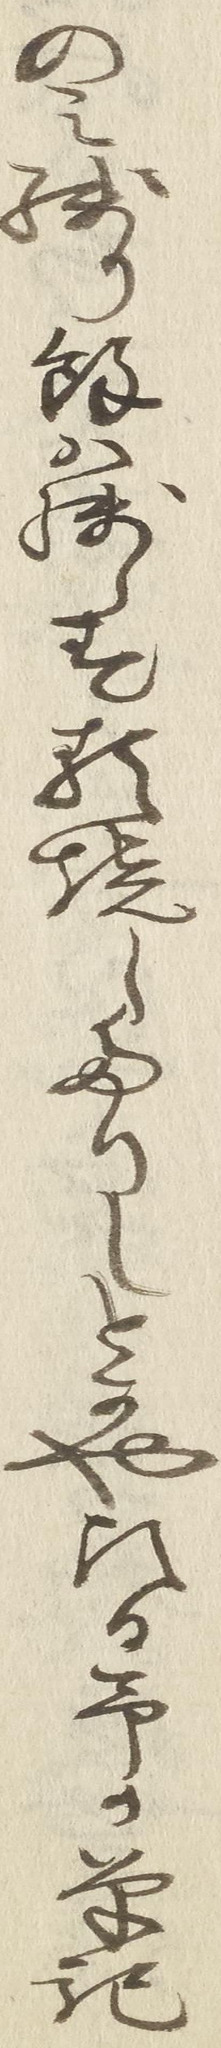み残り余は残らす類焼したりとかや頃日予の筆記
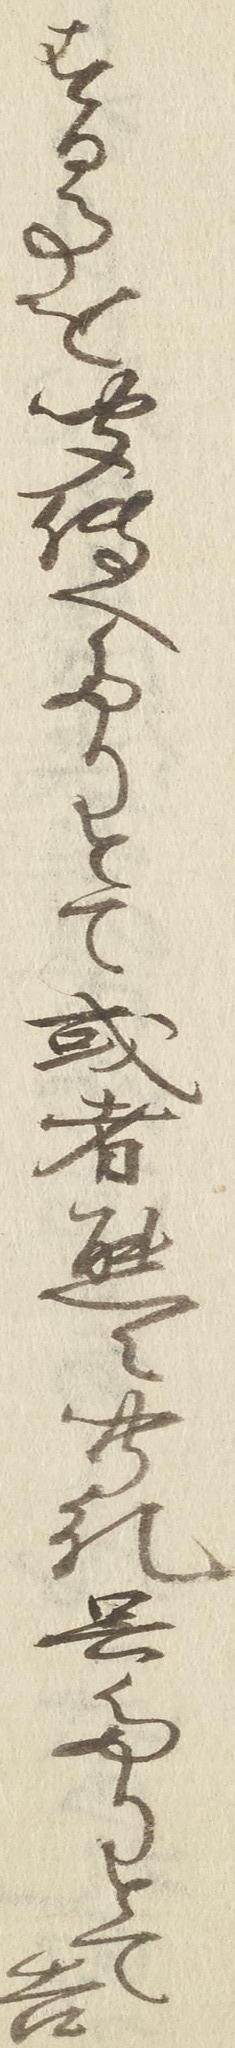する事を聞伝へたりとて或者態々聞糺呉たりとて告
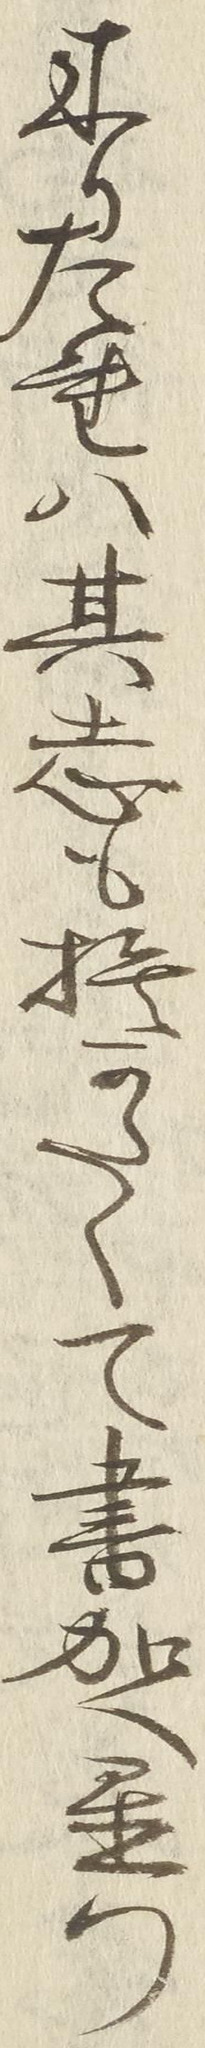来りたれは其志も捨かたくて書加へ置り
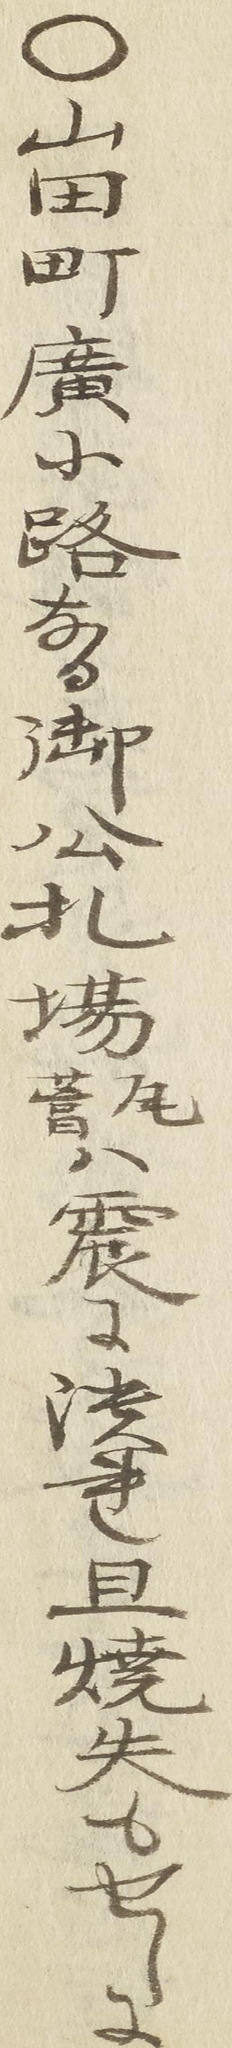〇山田町広小路なる御公札場瓦葺は震に潰れ且焼失もせしに
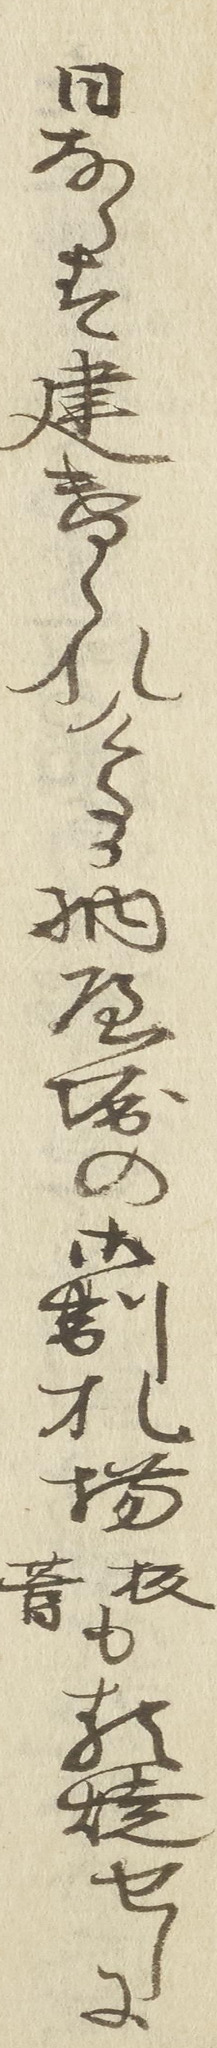日ならす建替くれけるか納屋堀の御制札場板葺も類焼せしに

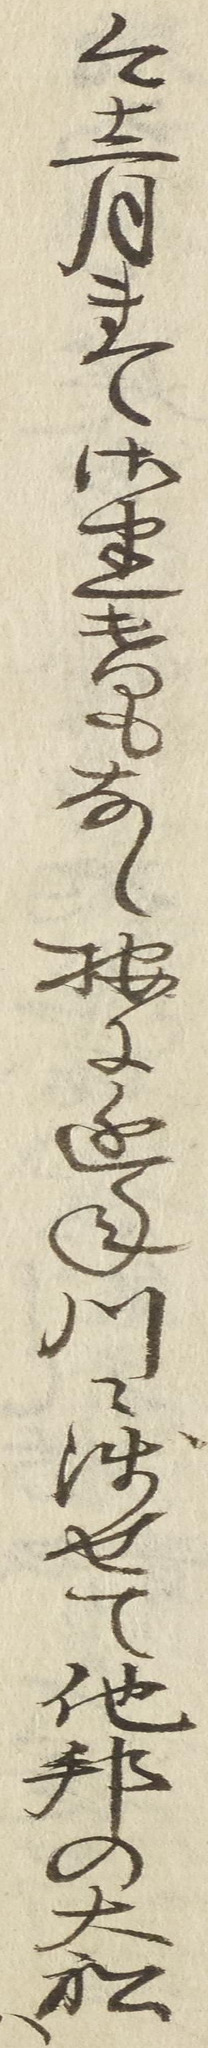今十二月まて御建替もなし按に近年川に渉せて他邦の大船は
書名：地震記　上
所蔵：東京大学地震研究所図書室 Earthquake Research Institute Library, The University of Tokyo, JAPAN
